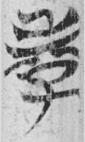孝
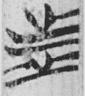者
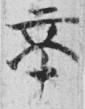不
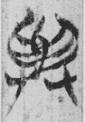與
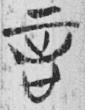言
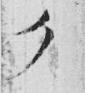人
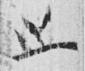之
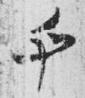父
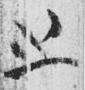之
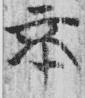不
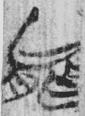能
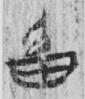畜
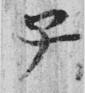子
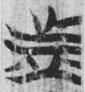者
